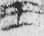王
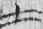士
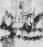疋
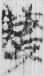○（葬）
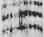王
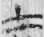士
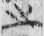之
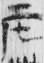宅
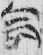命
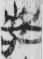若
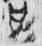疋
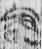命
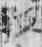○（鄢）
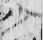少
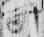司
